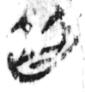皆
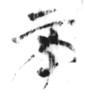不
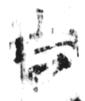吉
